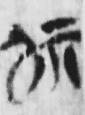𫵖
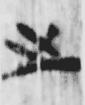之
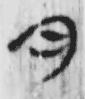月
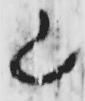乙
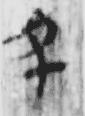丑
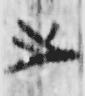之
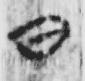日
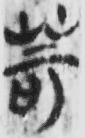苛
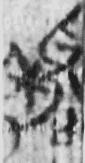○（嘉）
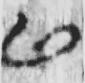㠯（以）
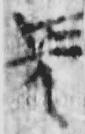長
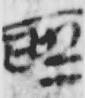爲
